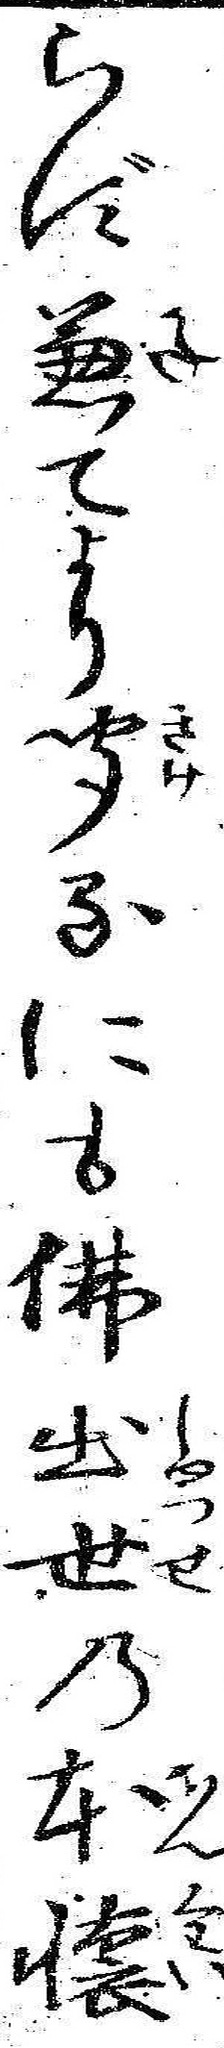らず兼てより聞るにも仏出世の本懐
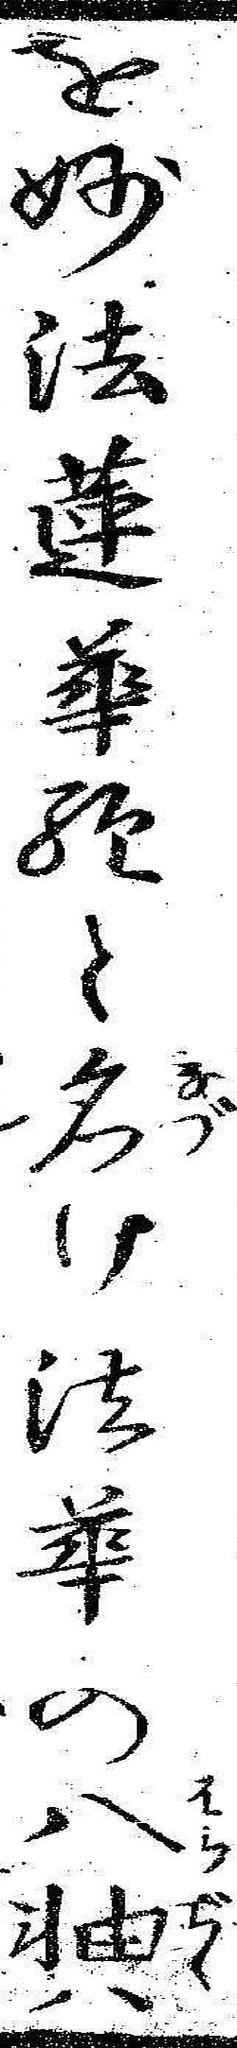を妙法蓮華経と名け法華の八軸は
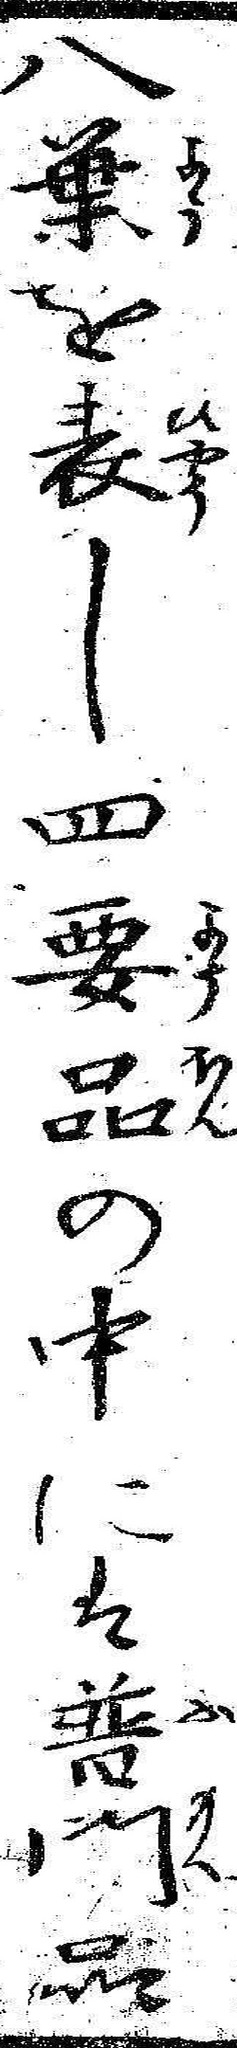八葉を表し四要品の中には普門品

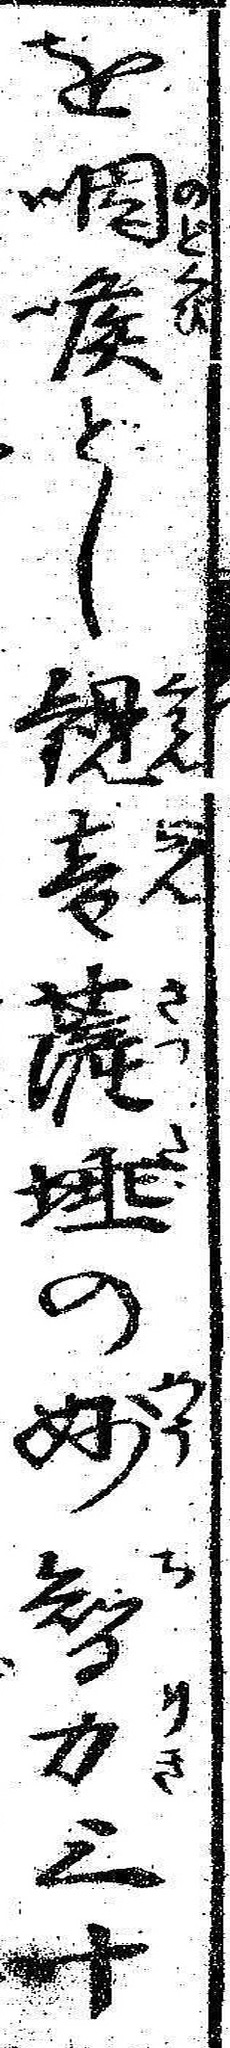を咽喉とし観音薩埵の妙智力三十
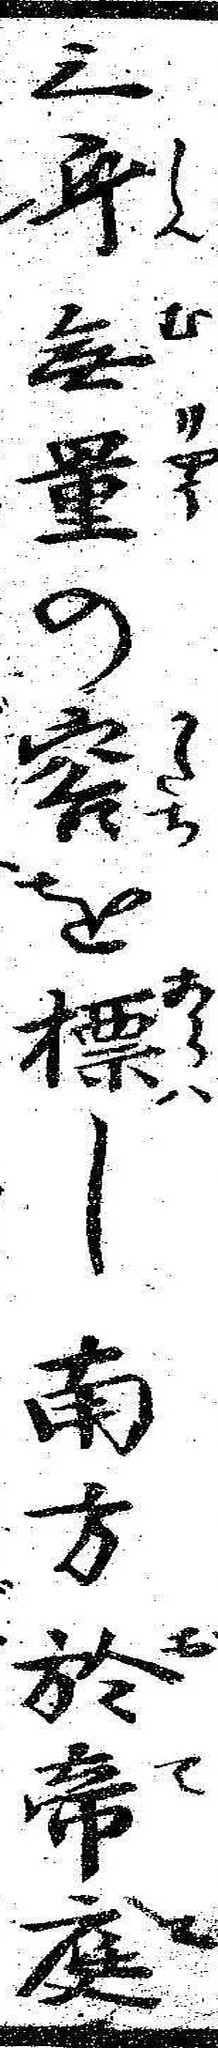三身無量の容を標し南方於帝庭
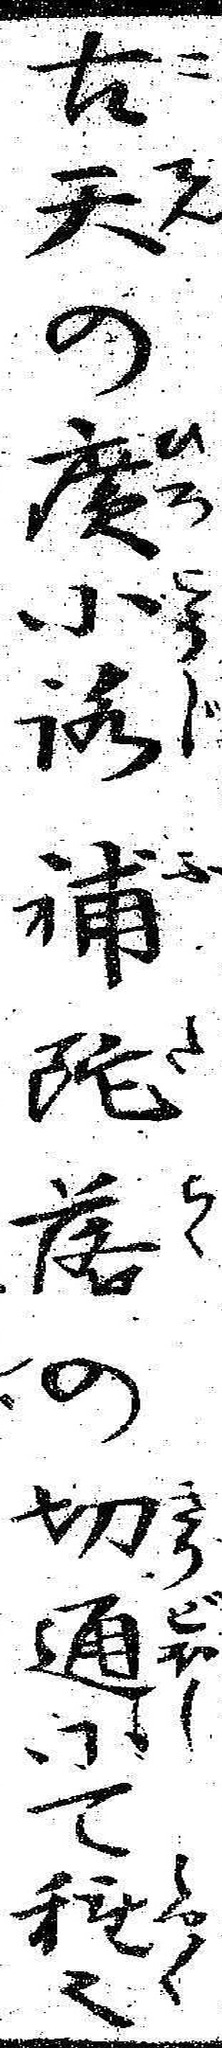古天の広小路補陀落の切通にて種々
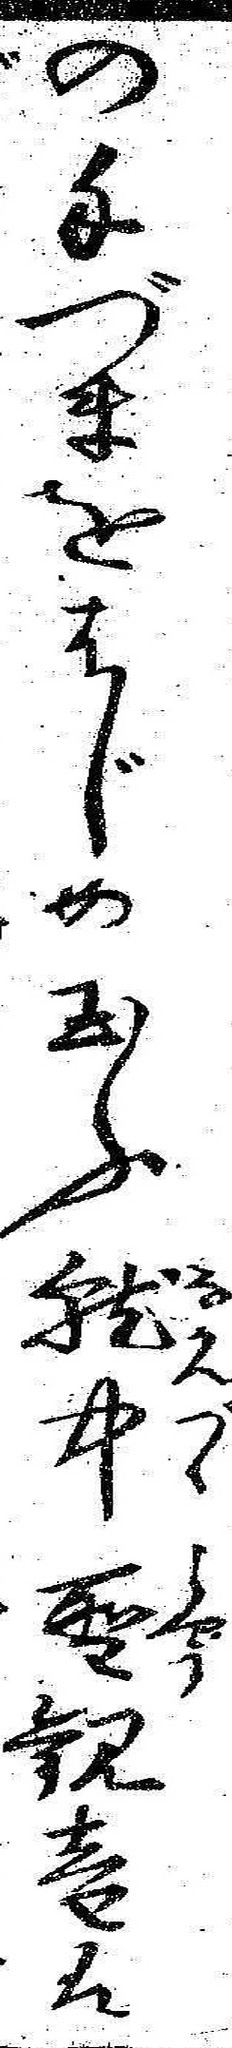の手づまをはじめ玉ふ就中聖観音は
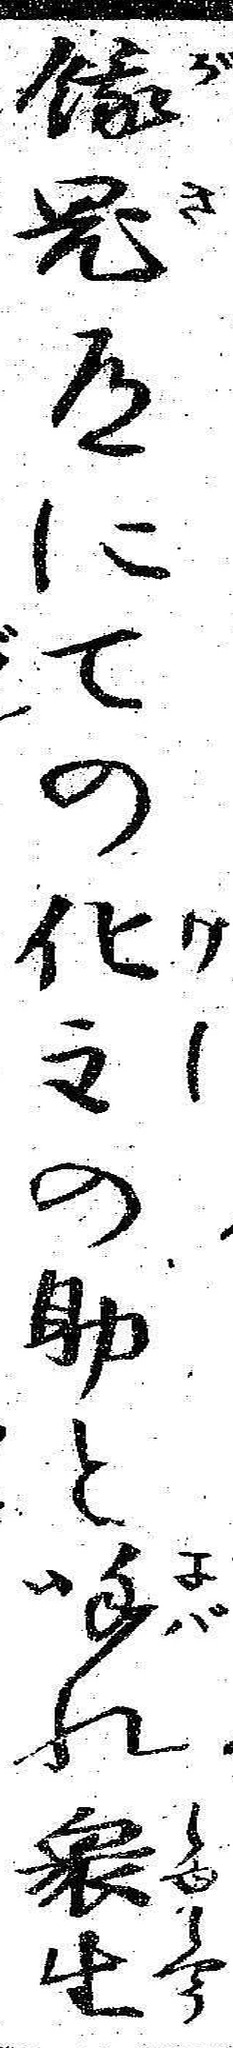餓鬼道にての化主の助と呼れ衆生
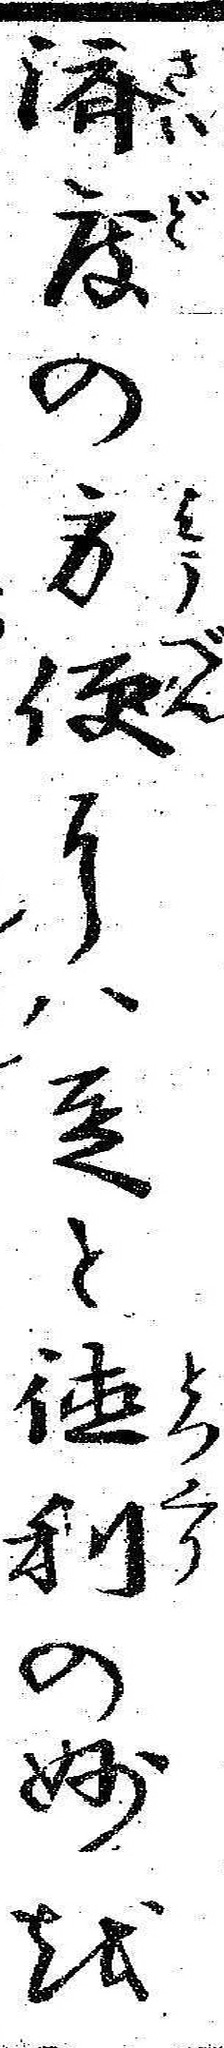済度の方便には豆と徳利の妙を
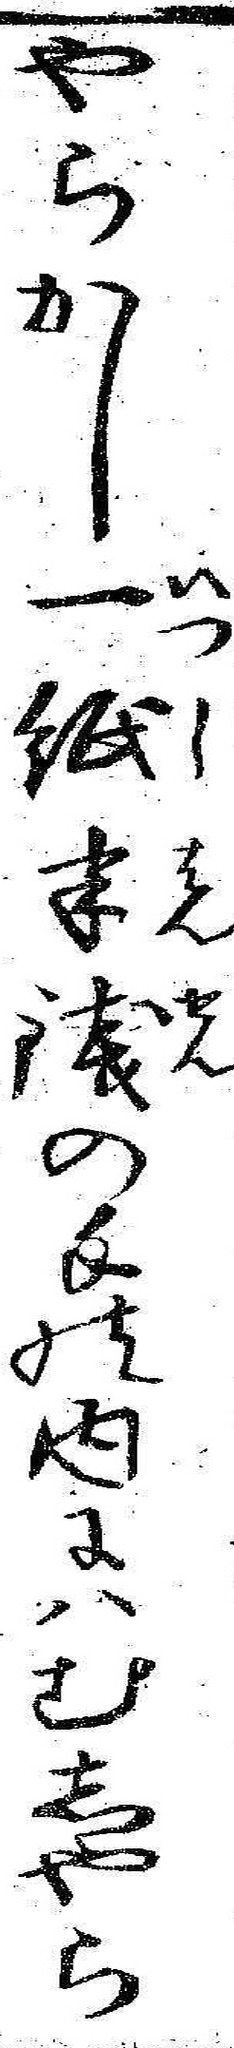やらかし一紙半銭の手の内にはむしやら
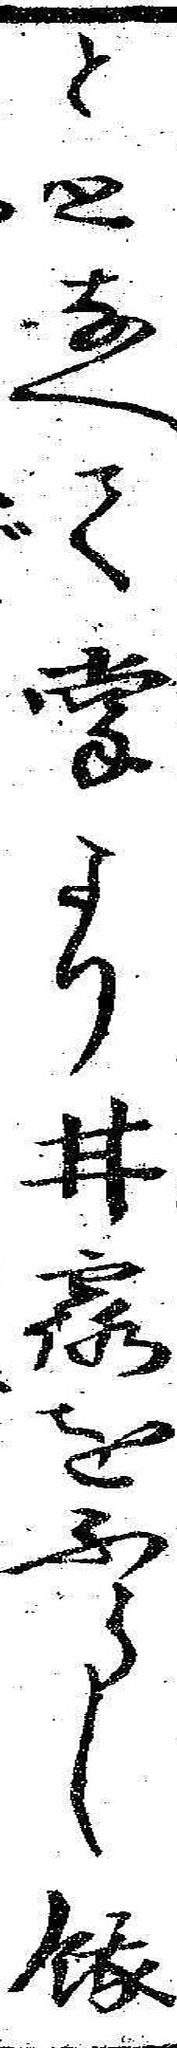ととなへて掌より甘露をふらし餓
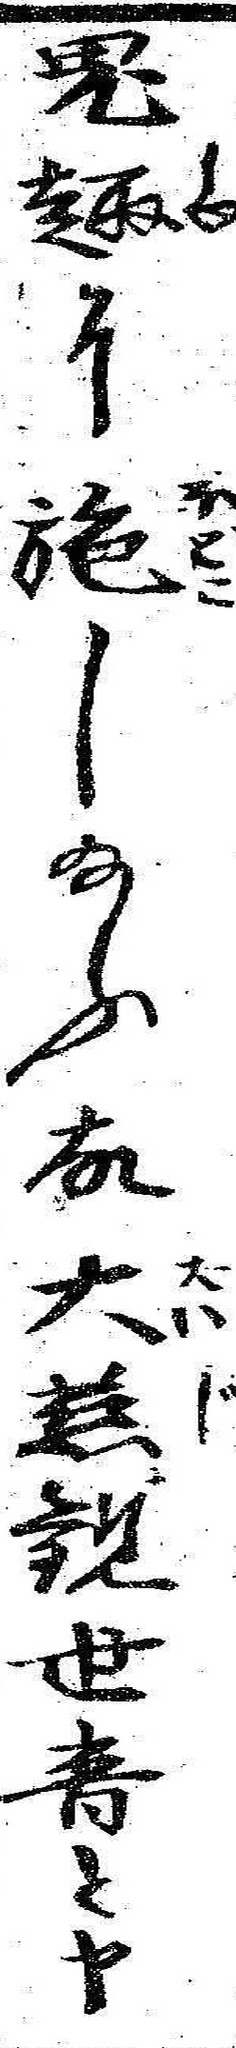鬼趣に施し給ふ故大慈観世音と申
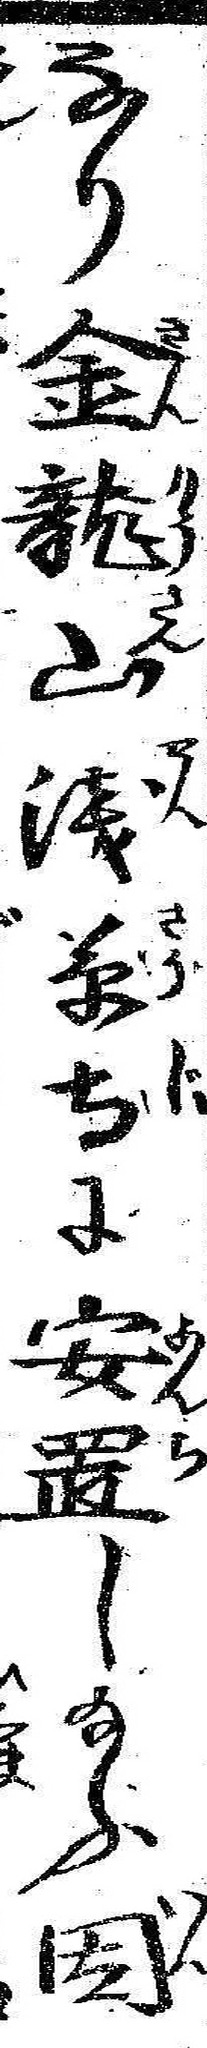なり金竜山浅草寺に安置し給ふ因
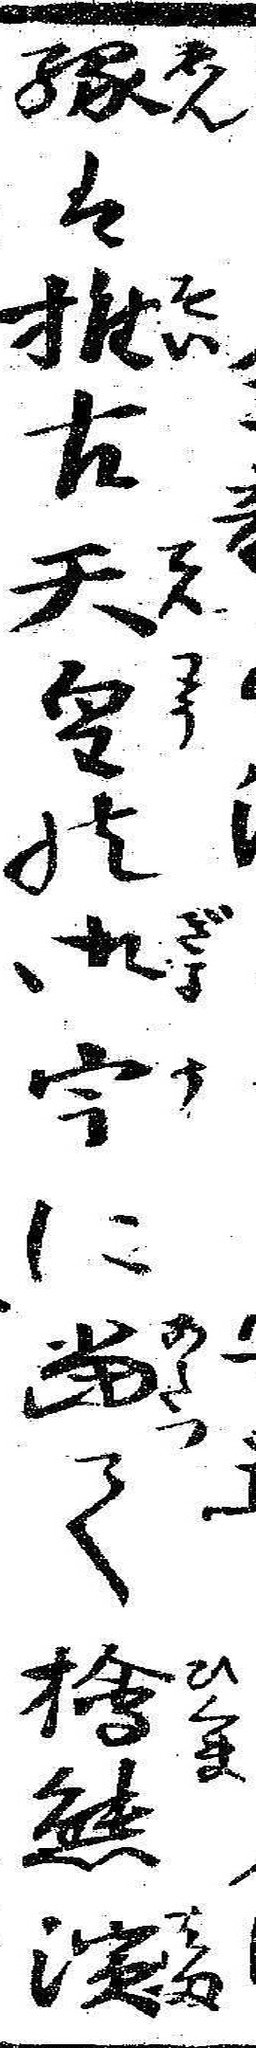縁は推古天皇の御宇に当て桧熊浜
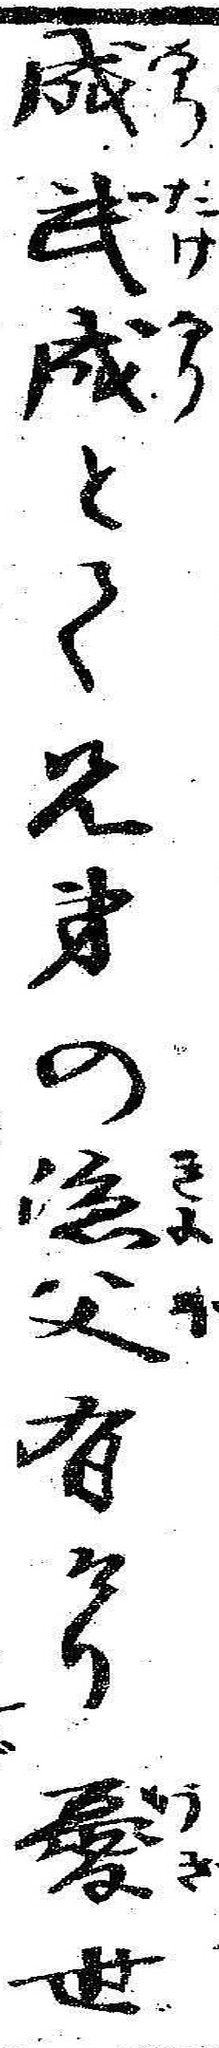成武成とて兄弟の漁父有けり憂世
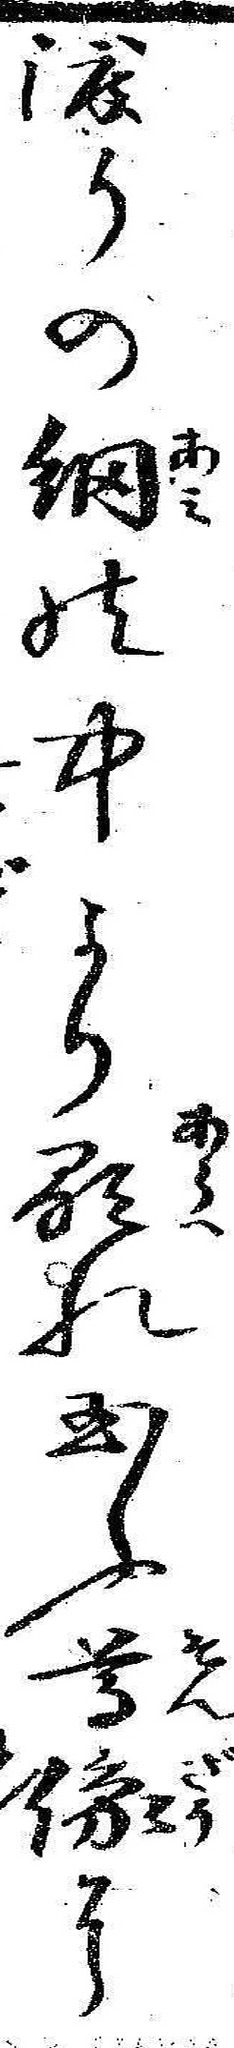渡りの網の中より顕れ玉ふ尊像に
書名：根無草後編
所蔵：国文学研究資料館
